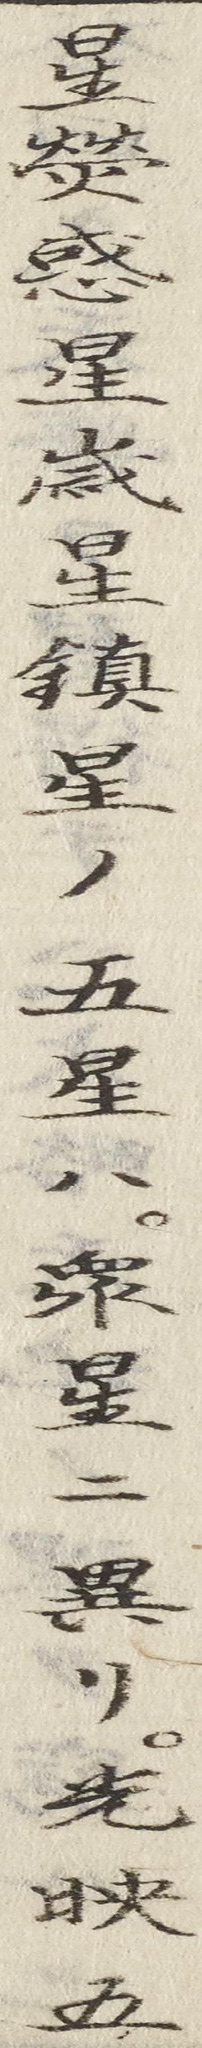星熒惑星歳星鎮星ノ五星ハ。衆星ニ異リ。光映五
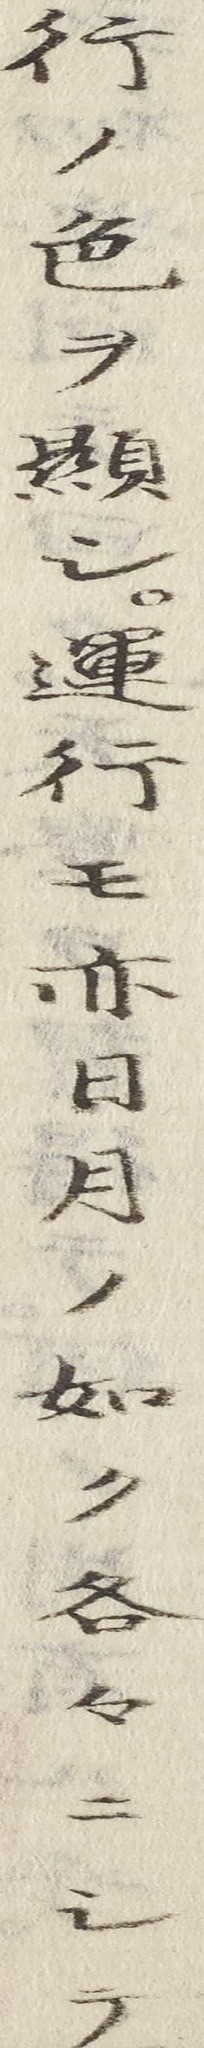行ノ色顕シ。運行モ亦日月ノ如ク各々ニシテ。
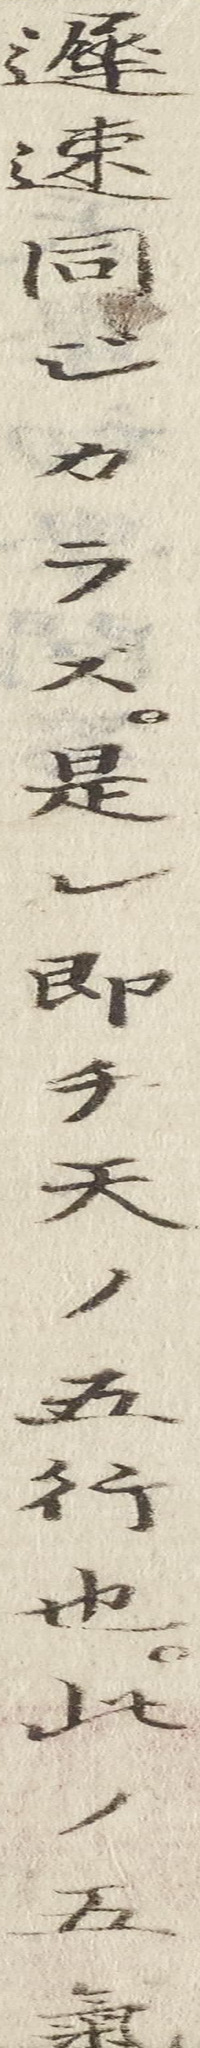遅速同ジカラズ。是レ即チ天ノ五行也。此ノ五気
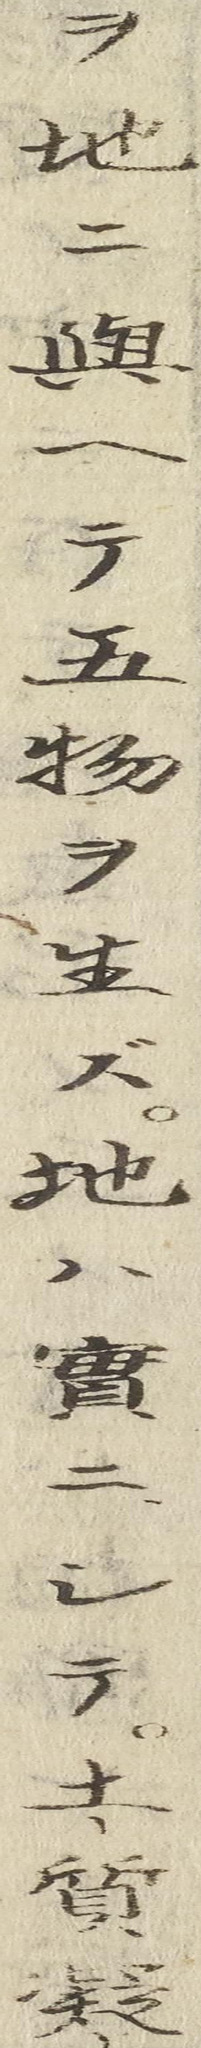ヲ地ニ与ヘテ五物ヲ生ズ。地ハ実ニシテ。土質凝
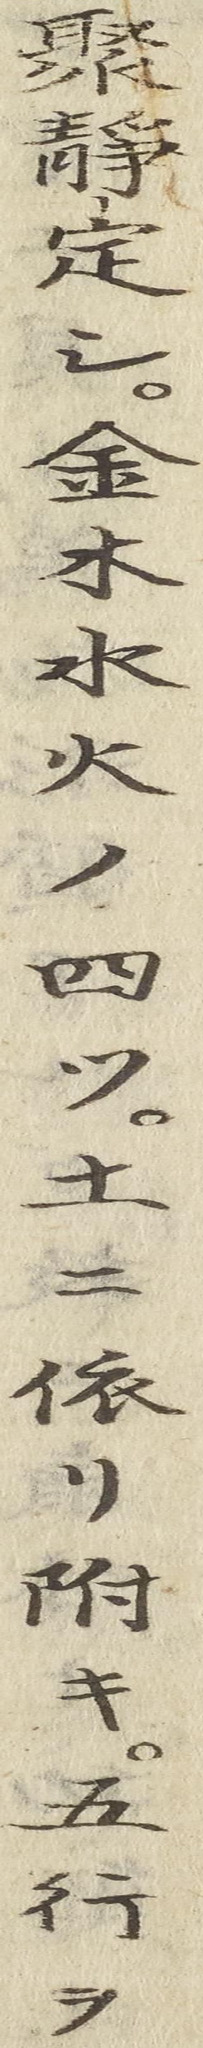聚静定シ。金木水火ノ四ツ。土ニ依リ附キ。五行ヲ
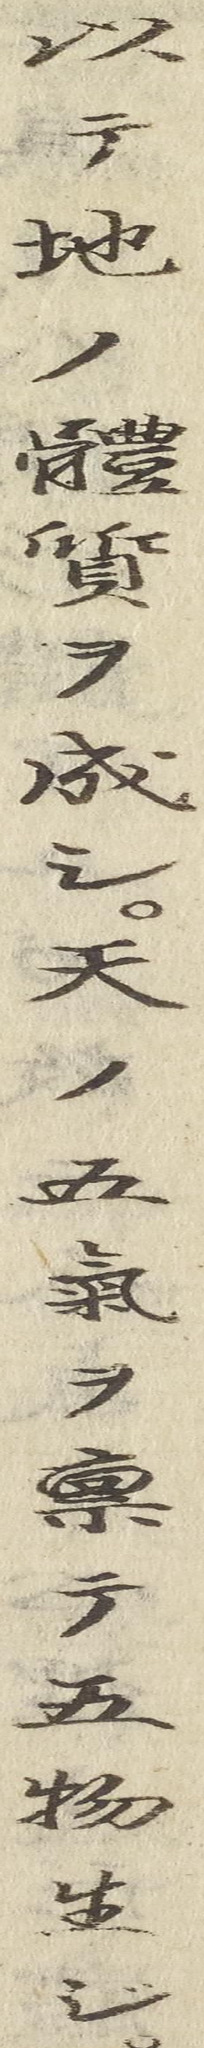以テ地ノ体質ヲ成シ。天ノ五気ヲ稟テ五物生シ。
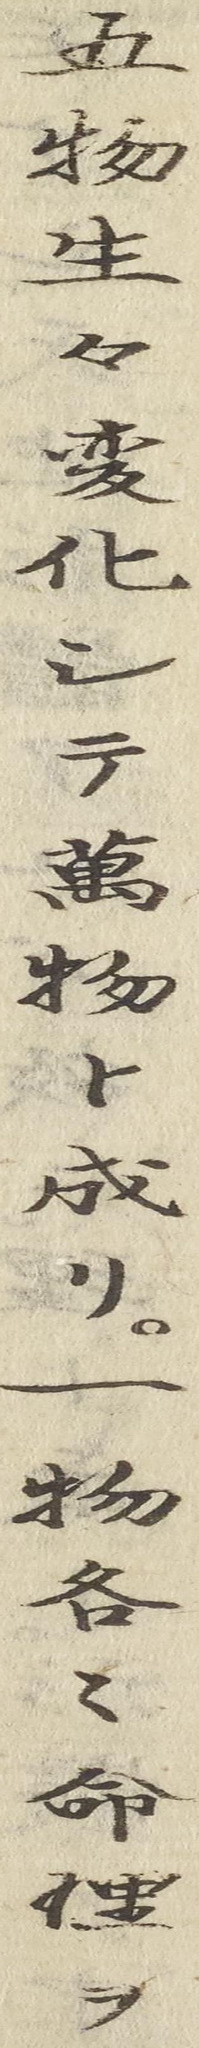五物生々変化シテ万物ト成リ。一物各〻命理ヲ
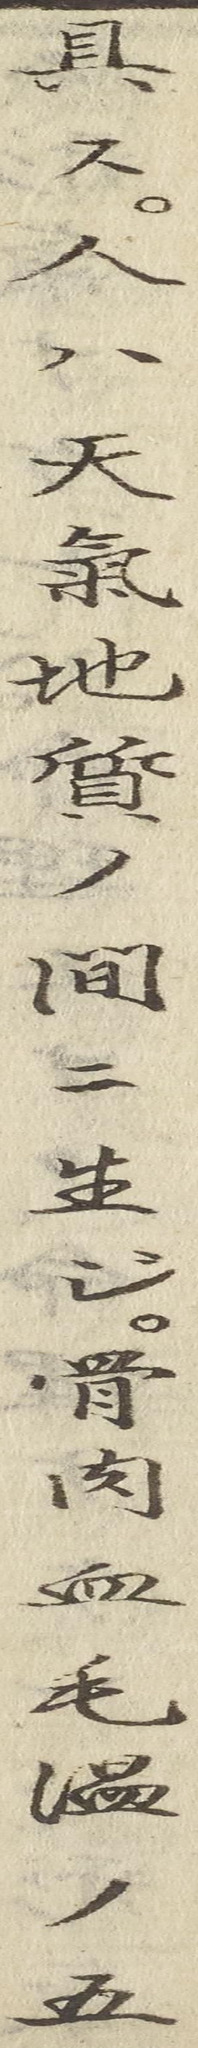具ス。人ハ天気地質ノ間ニ生ジ。骨肉血毛温ノ五
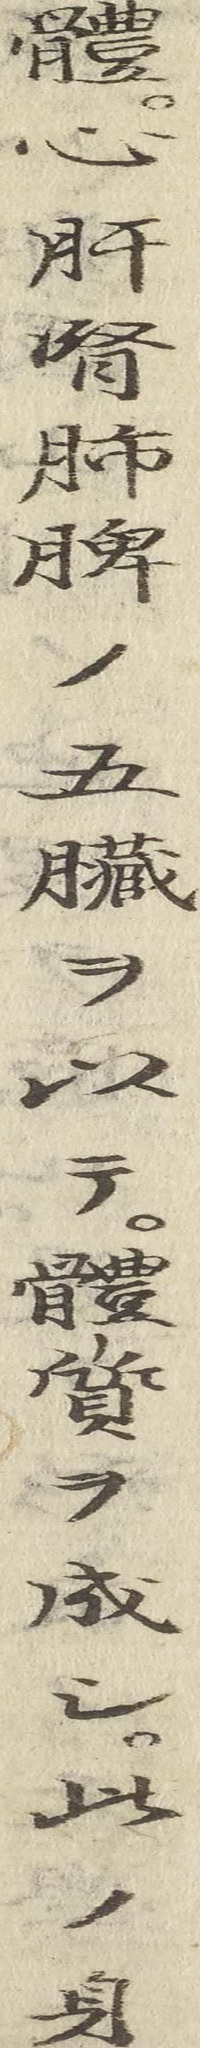体。心肝腎肺脾ノ五臓ヲ以テ。体質ヲ成シ。此ノ身
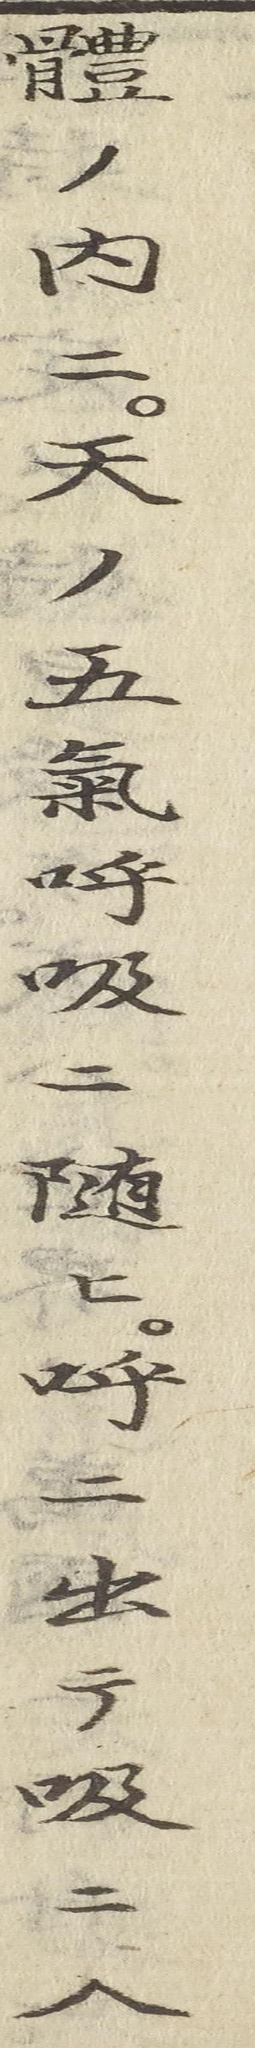体ノ内ニ。天ノ五気呼吸ニ随ヒ。呼ニ出テ吸ニ入
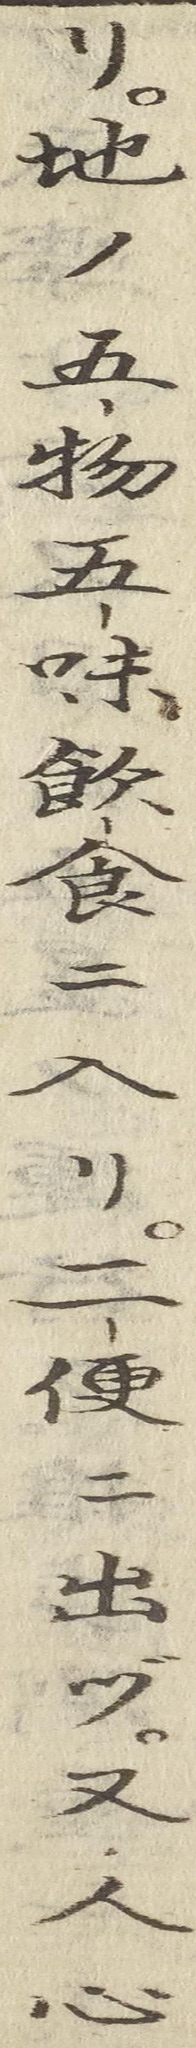リ。地ノ五物五味飲食ニ入リ。二便ニ出ヅ。又人心
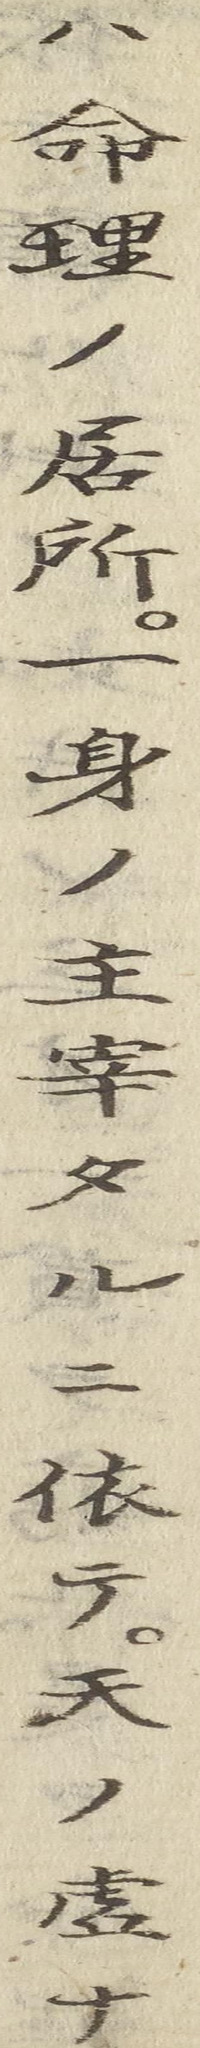ハ命理ノ居所。一身ノ主宰タルニ依テ。天ノ虚ナ
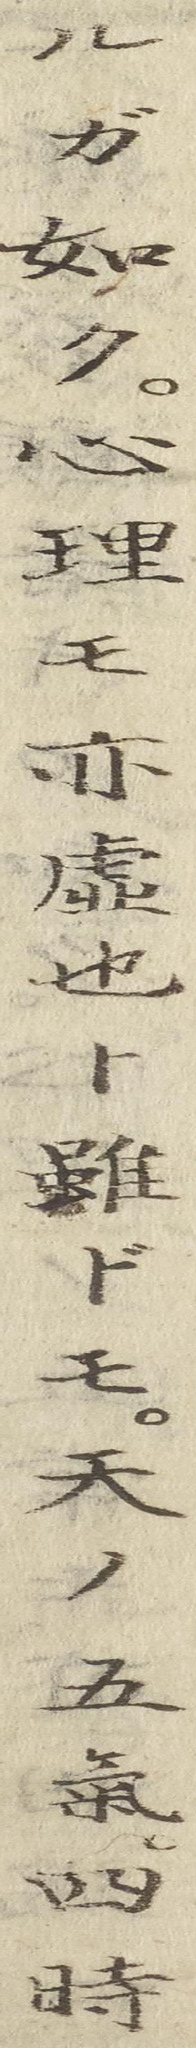ルガ如ク。心理モ又虚也ト雖ドモ。天ノ五気。四時

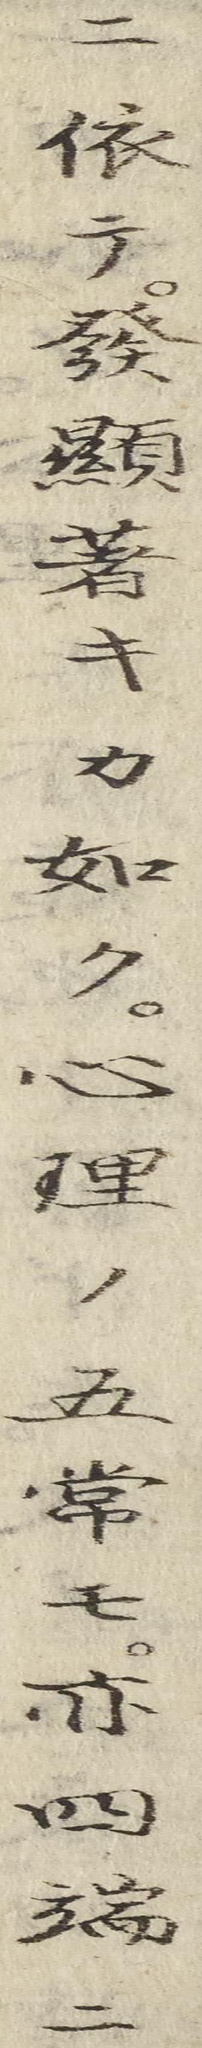ニ依テ。発顕著キカ如ク。心理ノ五常モ。亦四端ニ
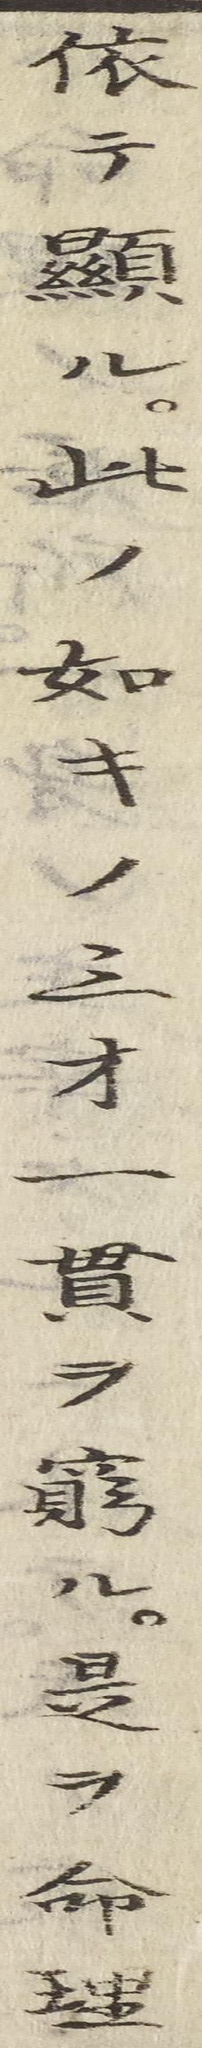依テ顕ル。此ノ如キノミ才一貫ヲ窮ル。是ヲ命理
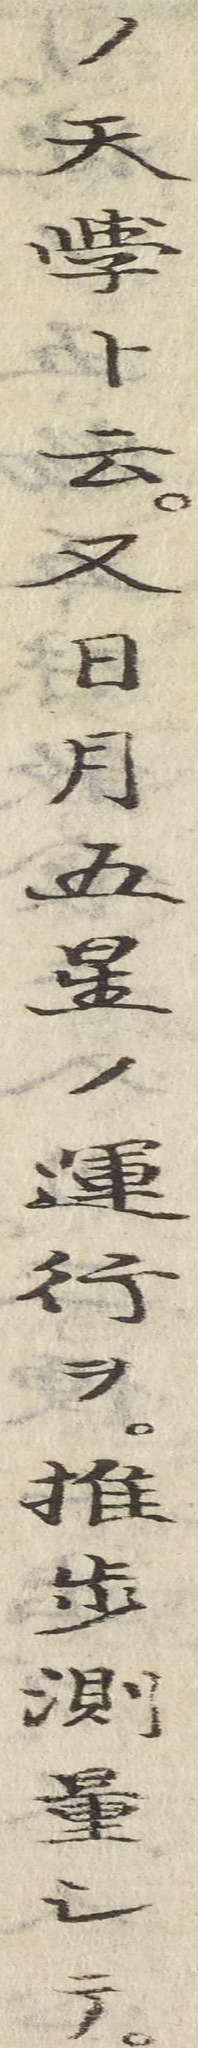ノ天学ト云。又日月五星ノ運行ヲ。推歩測量シテ。
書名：大略天学名目鈔　天經或問附録
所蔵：東京大学地震研究所図書室 Earthquake Research Institute Library, The University of Tokyo, JAPAN
